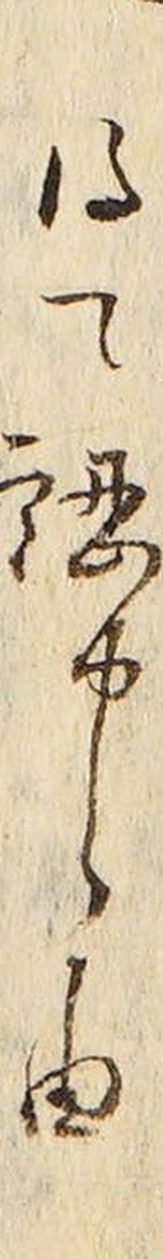得て認申候由
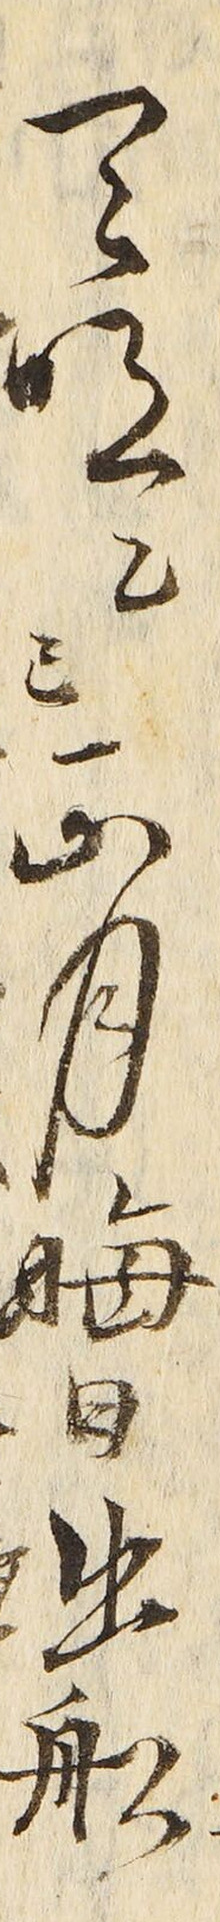天明乙巳正月晦日出船
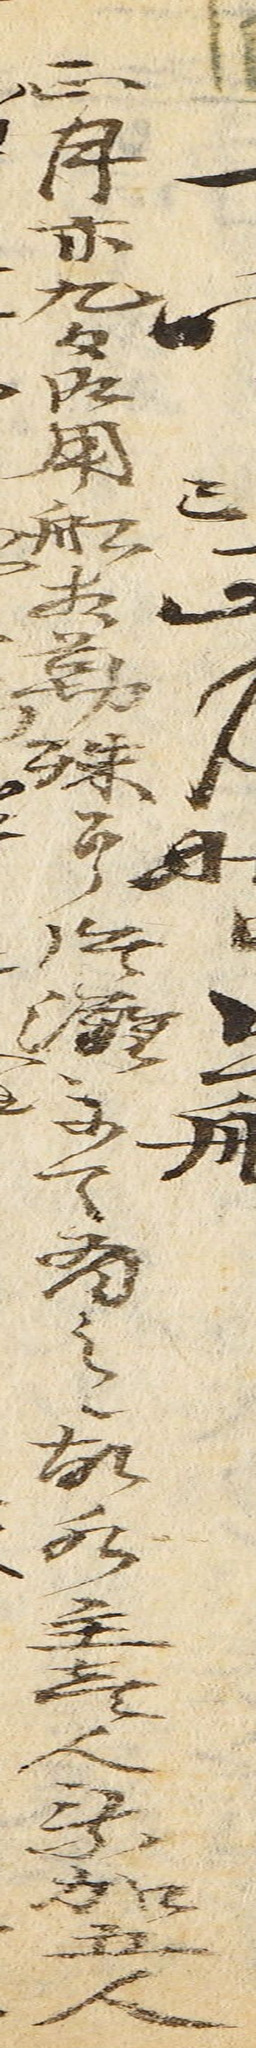一正月廿九日御用船相勤殊に片灘にて有之候故水主壱人乗加五人
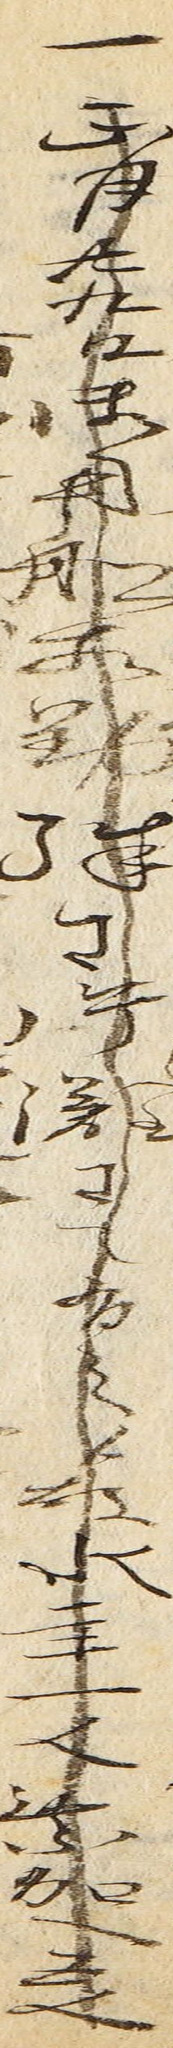一正月廿九日御用船相勤殊に片灘にて有之候故水主壱人乗加五人
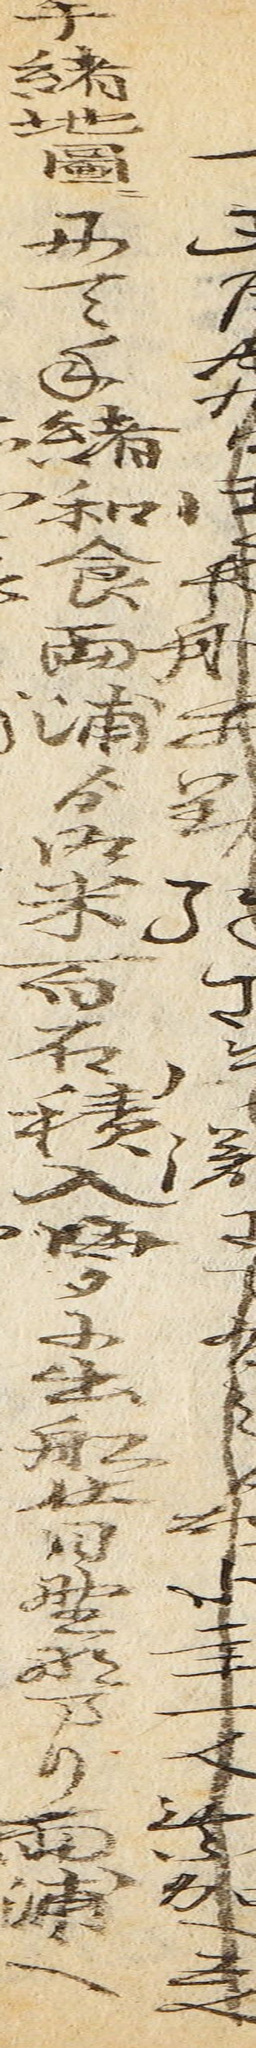にて手緒和食両浦ゟ御米百石積入晦日に出船仕日野なまり両浦へ
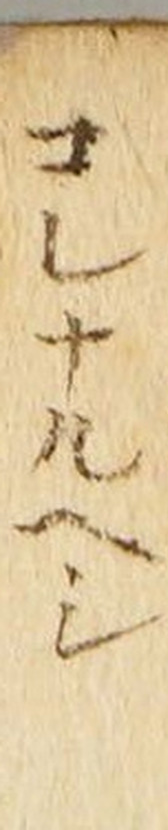コレナルヘシ
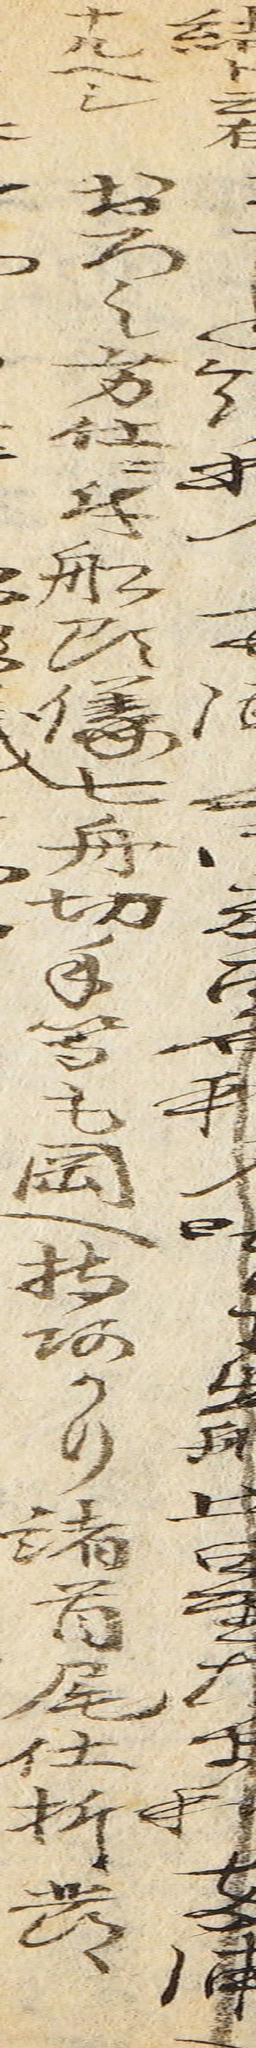おろし方仕ニ付船頭儀七舟切手等も岡へ持あかり諸首尾仕折節
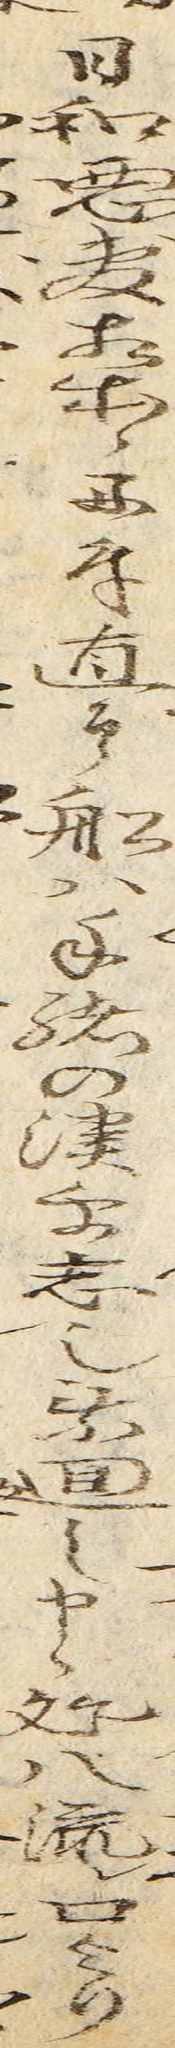日和悪敷相成候に付直に船ハ手緒の湊を志し乗廻し申候処八流れ口より
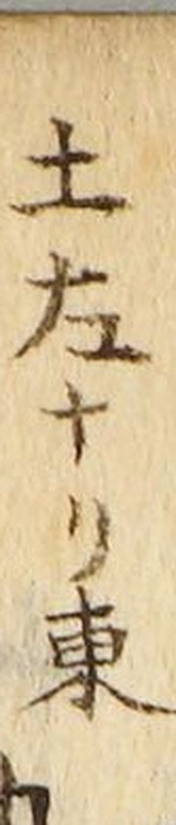土左ナリ東
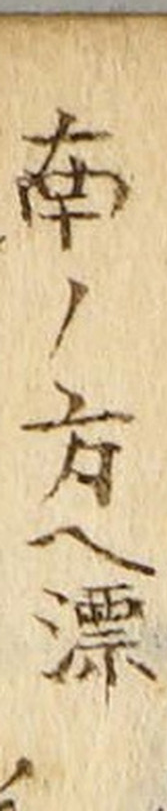南ノ方へ漂
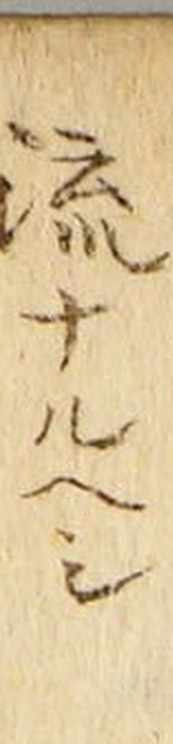流ナルヘシ
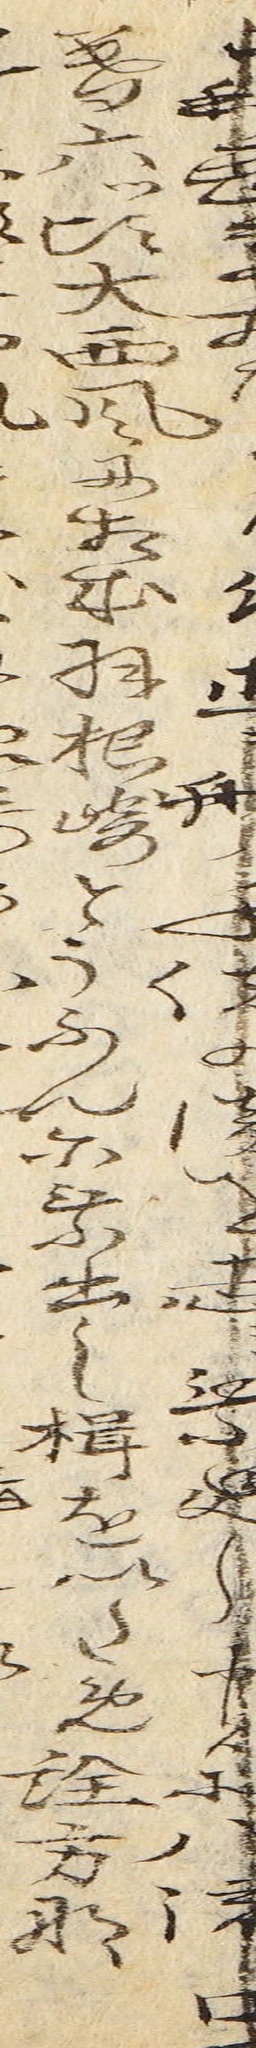暮六ツ頃大西風に相成羽根崎とうふんに乗し楫をいため詮方な
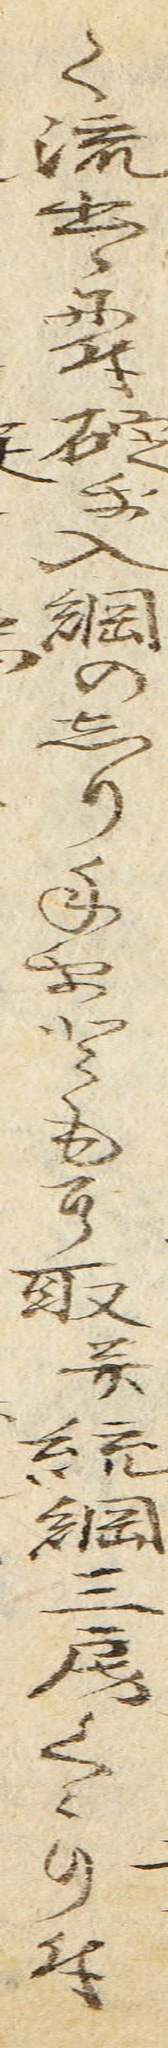く流出候に付碇を入綱のしり手をともに取并統綱三房くゝり付
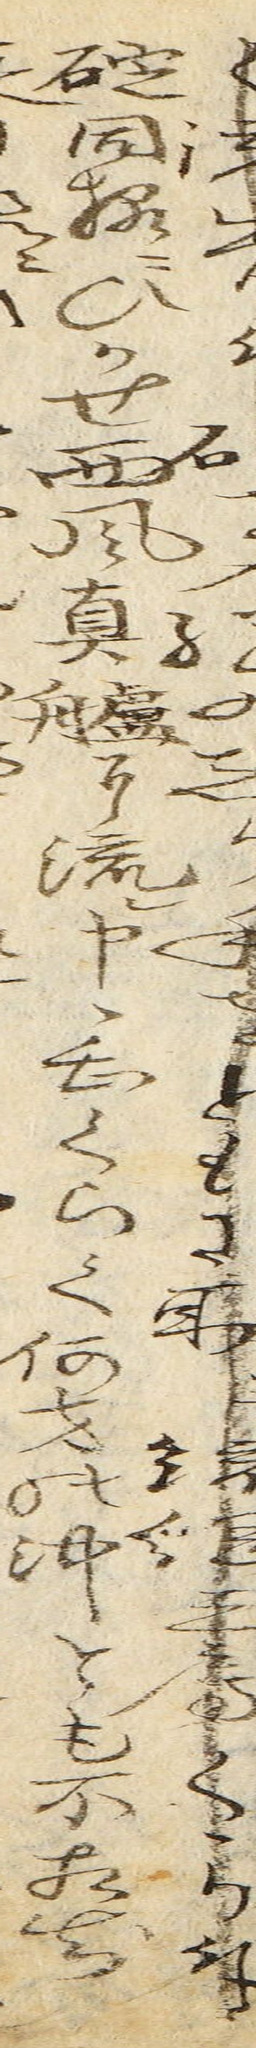碇同様ニひかせ西風真艫に流レ申候甚くらく何方の沖とも不相知
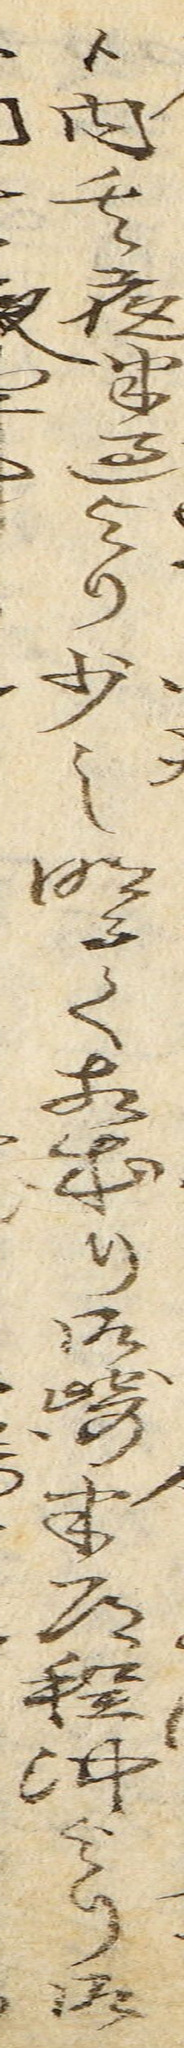候内其夜半過より少し明るく相成り御崎半道程沖より御
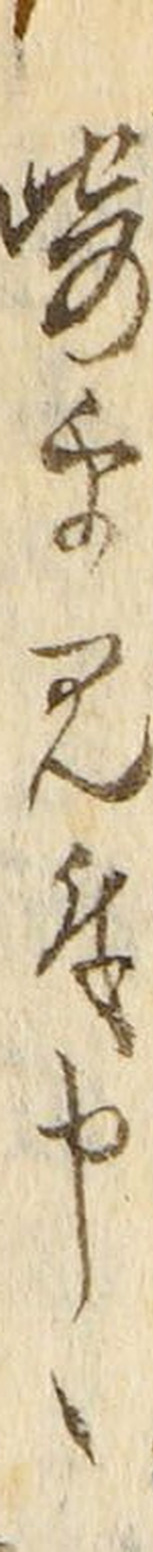崎を見付申候
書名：無人島漂流書付
